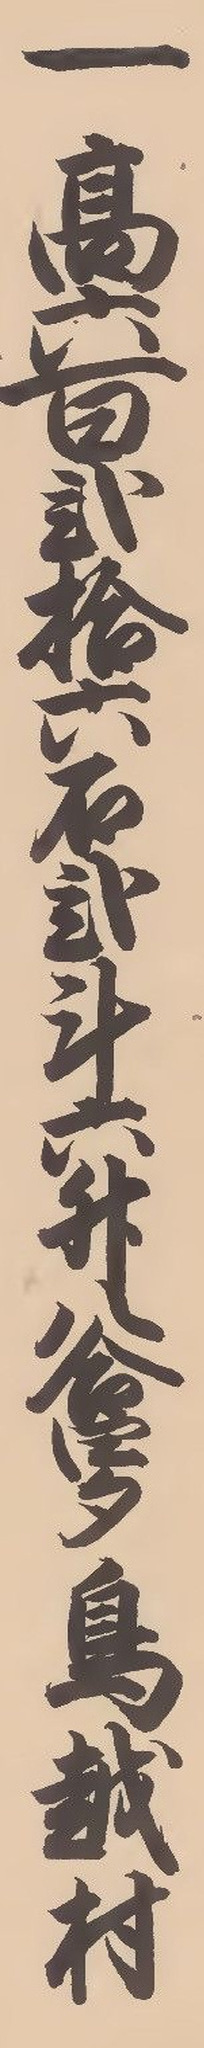一髙六百弐拾六石弐斗六升八合四夕鳥越村
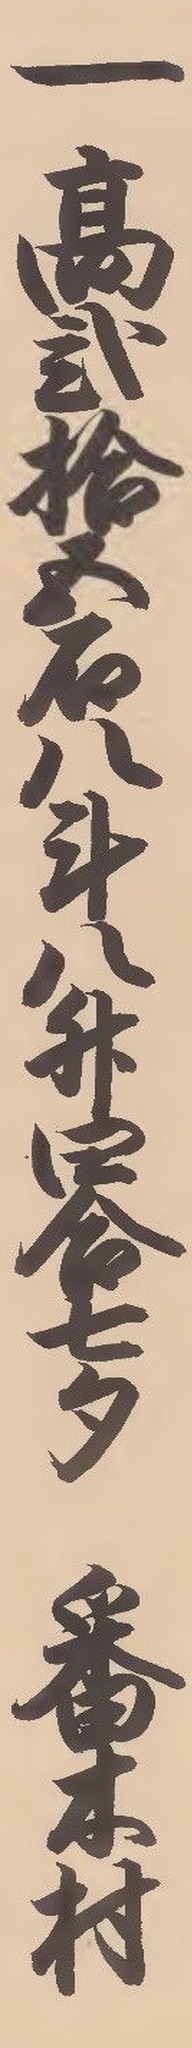一髙弐拾五石八斗八升四合七夕番木村
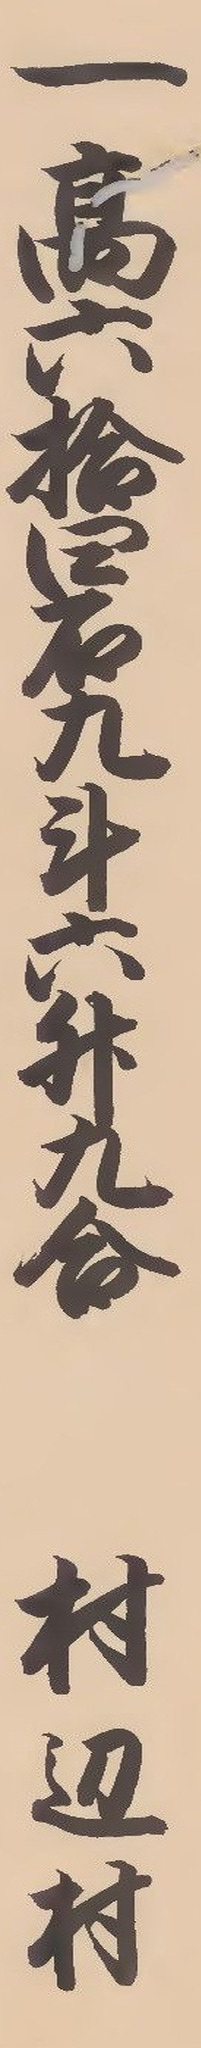一髙六拾四石九斗六升九合村辺村
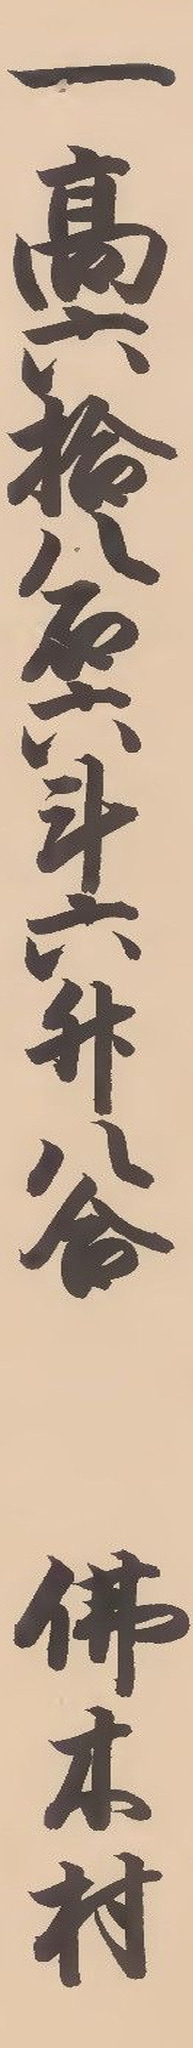一髙六拾八石六斗六升八合佛木村
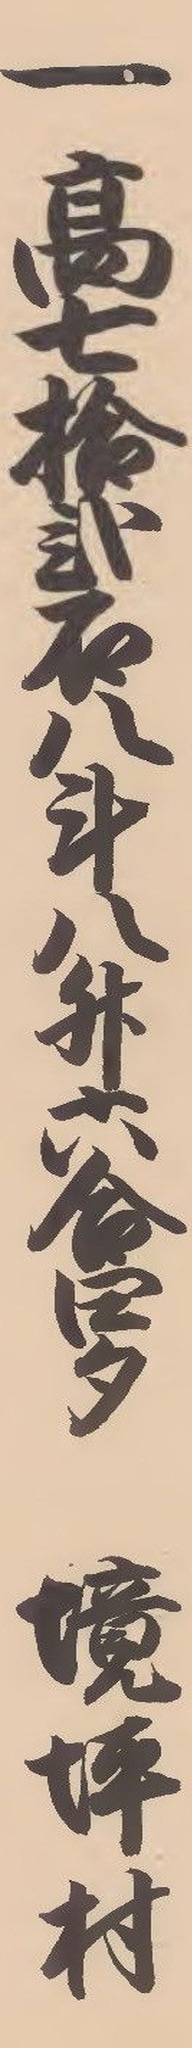一髙七拾弐石八斗八升六合四夕境坪村
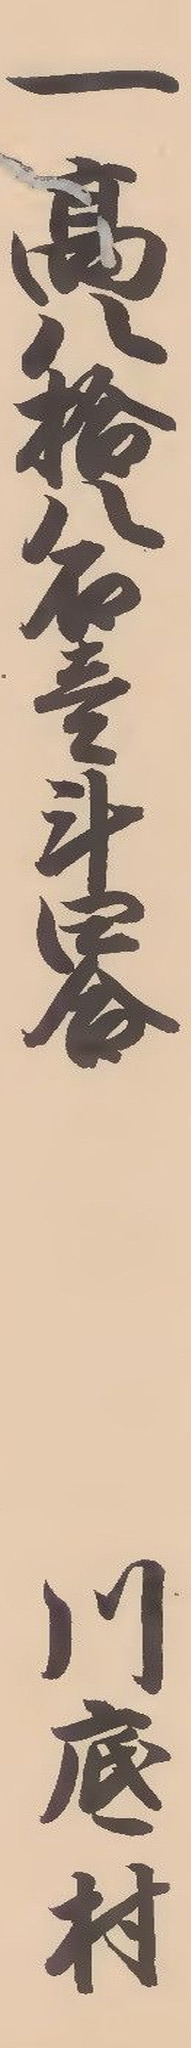一髙八拾八石壱斗四合川底村
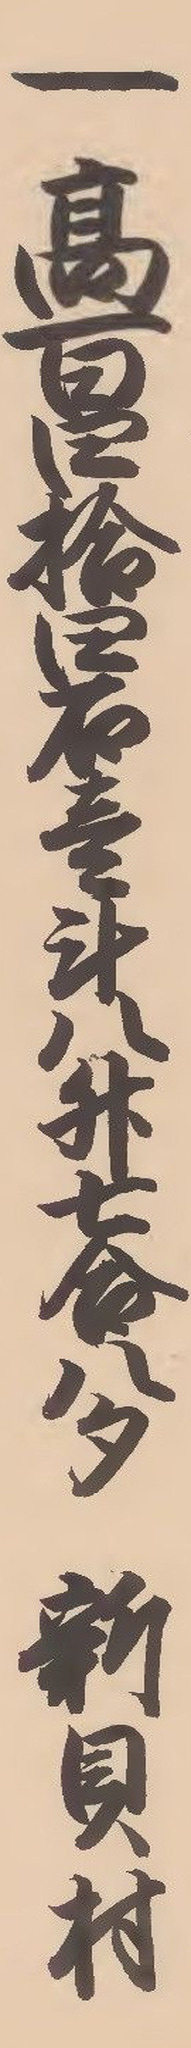一髙百四拾四石壱斗八升七合八夕新貝村
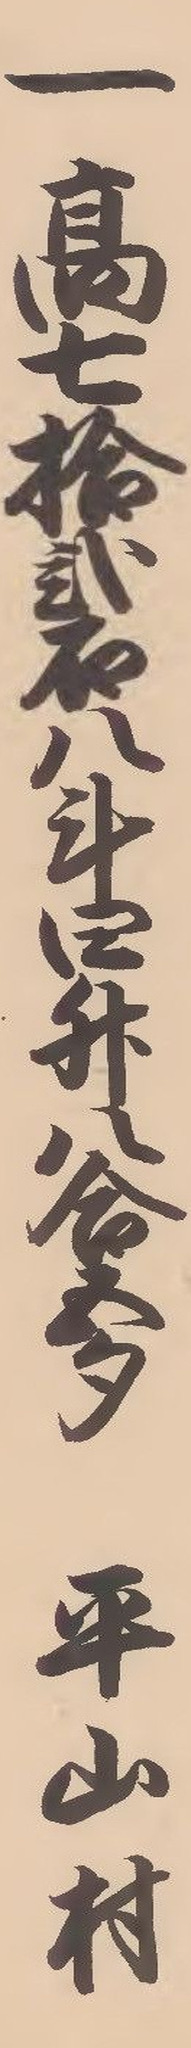一髙七拾弐石八斗四升八合五夕平山村

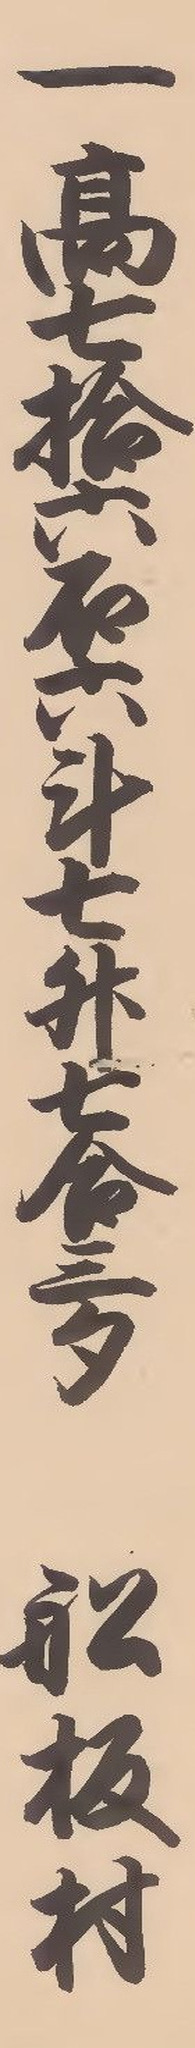一髙七拾六石六斗七升七合三夕舩板村
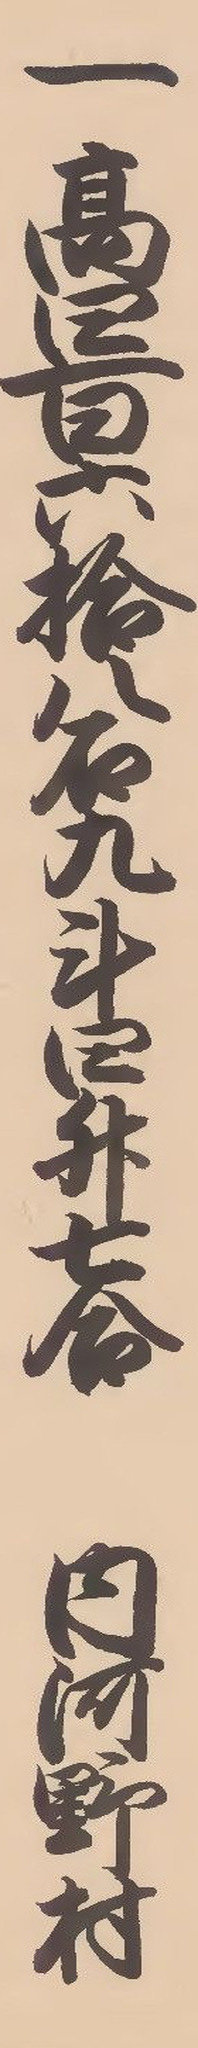一髙四百六拾八石九斗四升七合内河野村
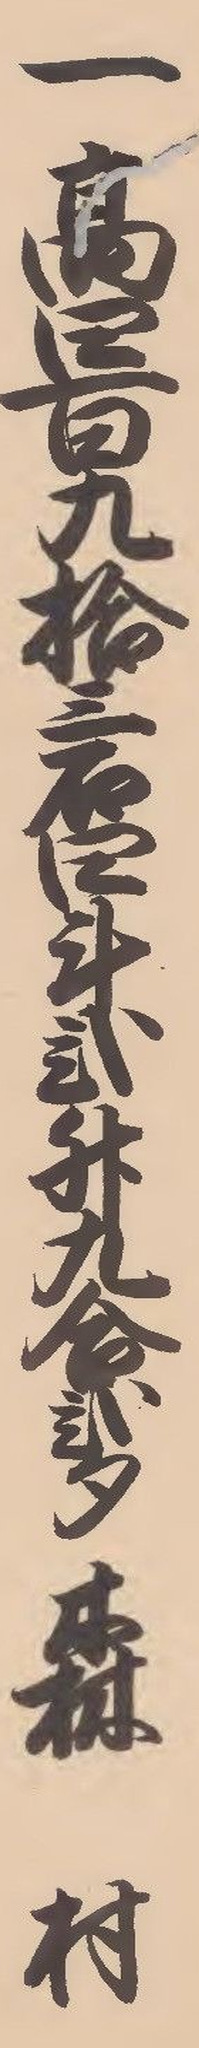一髙四百九拾三石四斗弐升九合弐夕森村
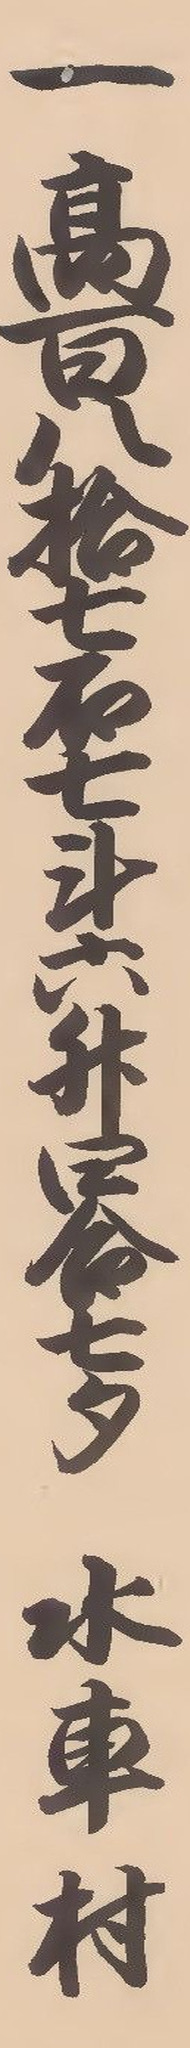一髙百八拾七石七斗六升四合七夕水車村
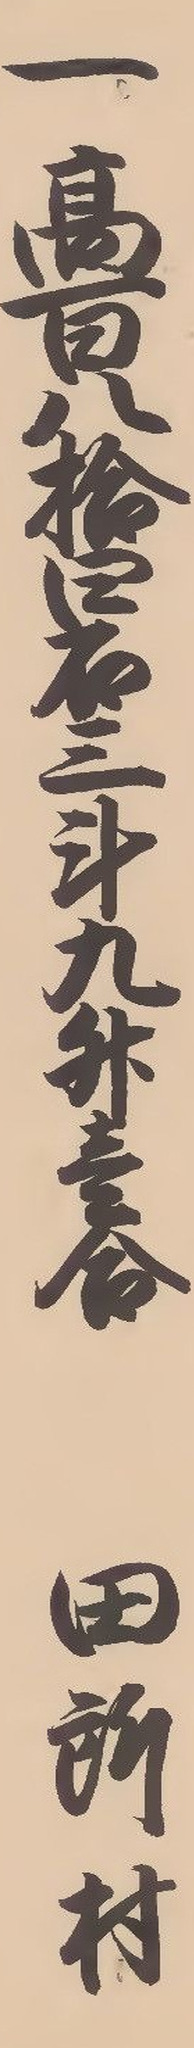一髙百八拾四石三斗九升壱合田所村
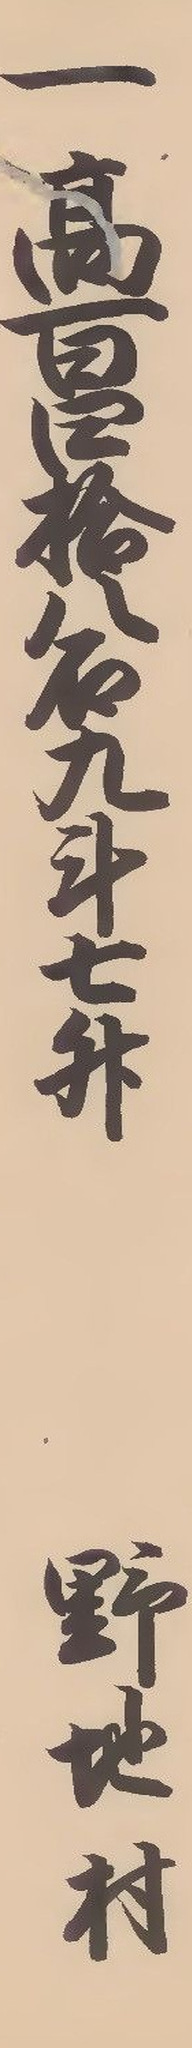一高百四拾八石九斗七升野地村
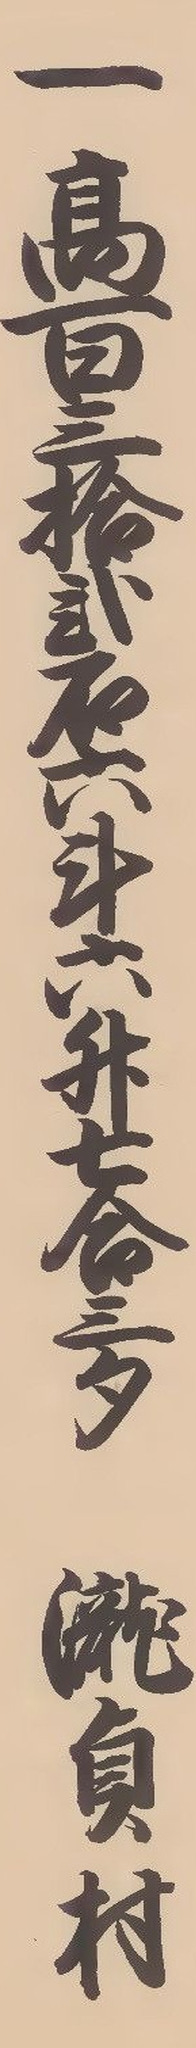一髙百三拾弐石六斗六升七合三夕瀧貞村
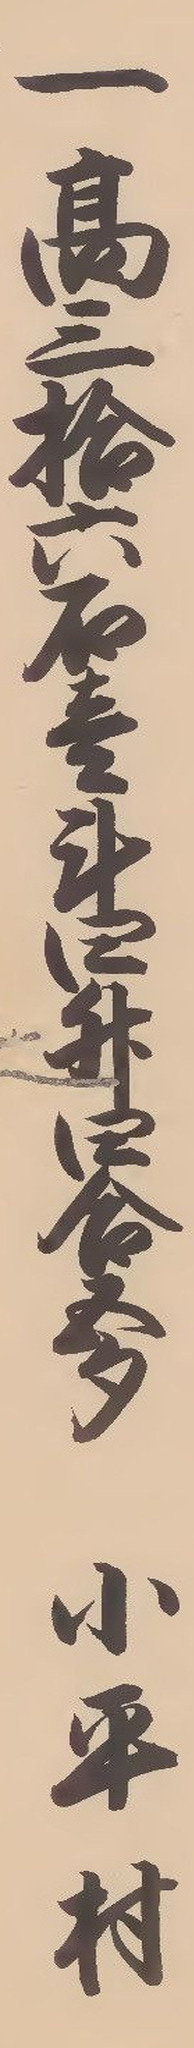一髙百三拾六石壱斗四升四合五夕小平村
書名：豊前国郷帳
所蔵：国立公文書館 National Archives of Japan
